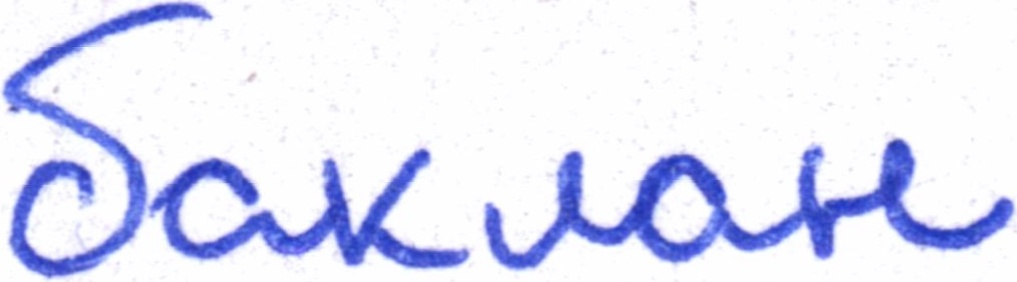баклан
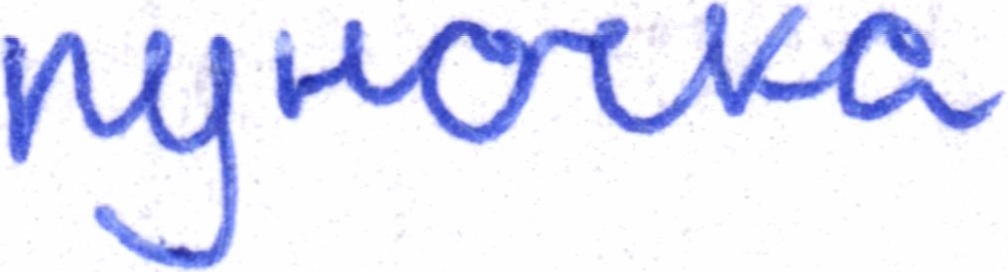пуночка
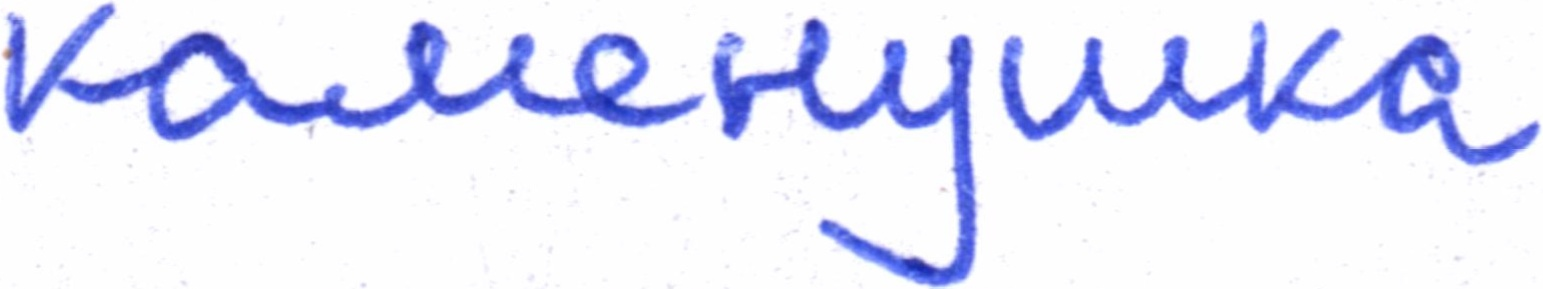каменушка
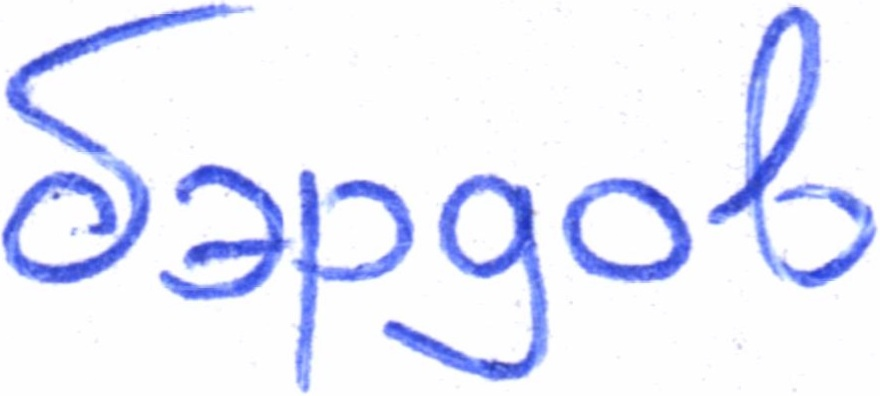бэрдов
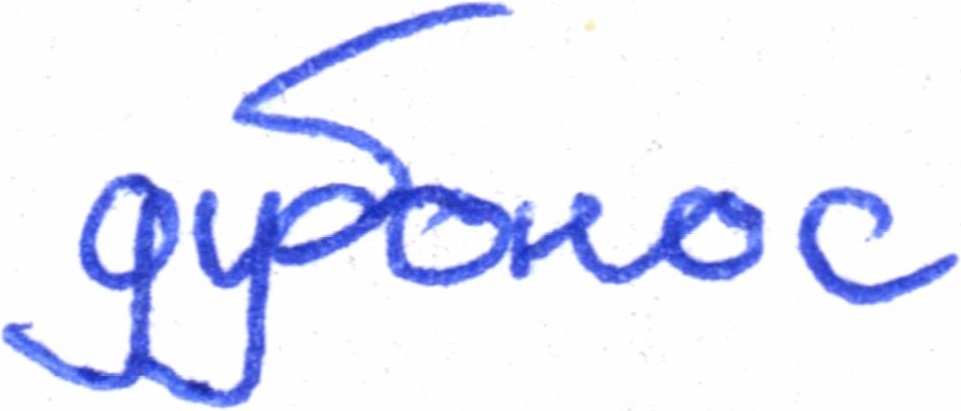дубонос
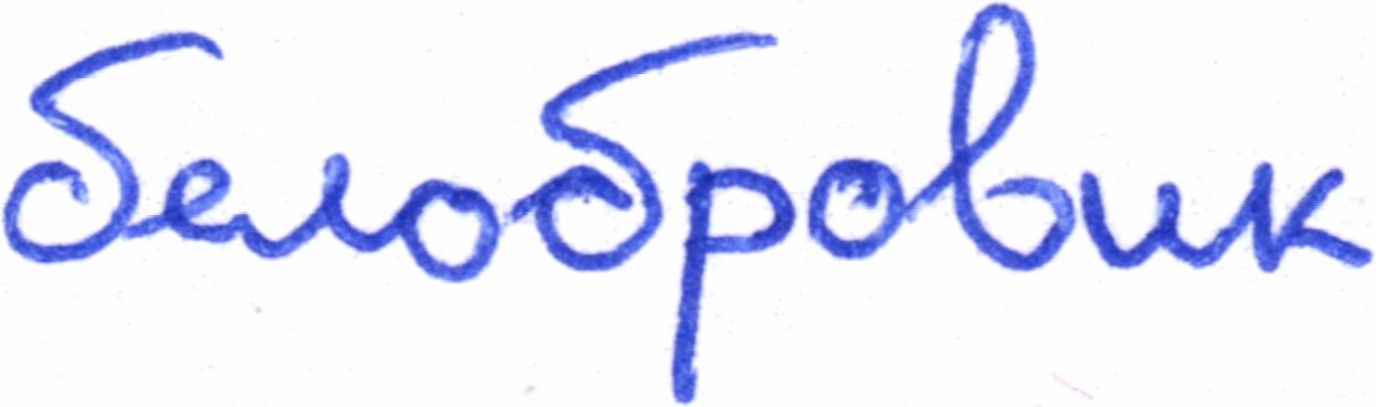белобровик
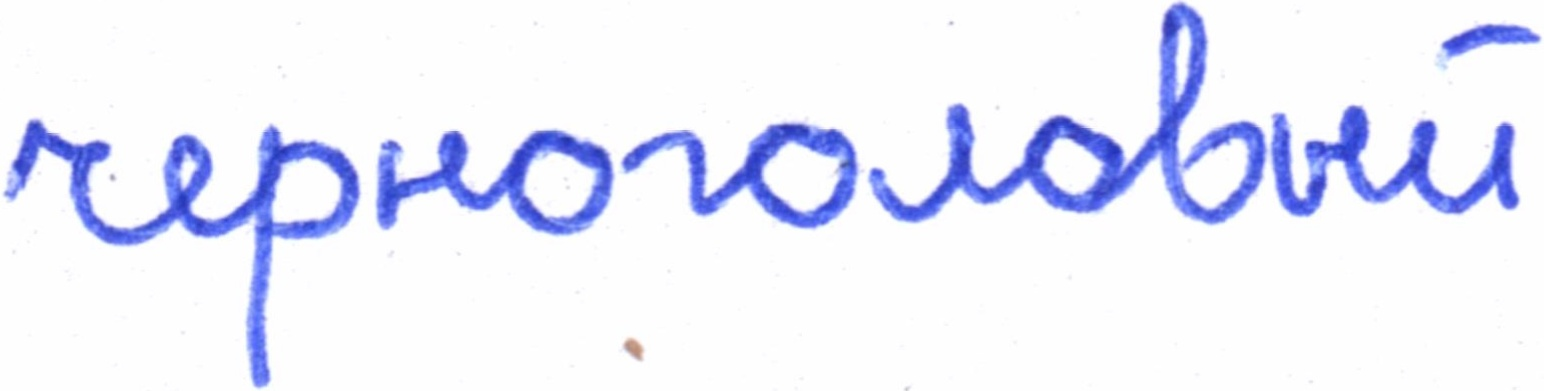черноголовый
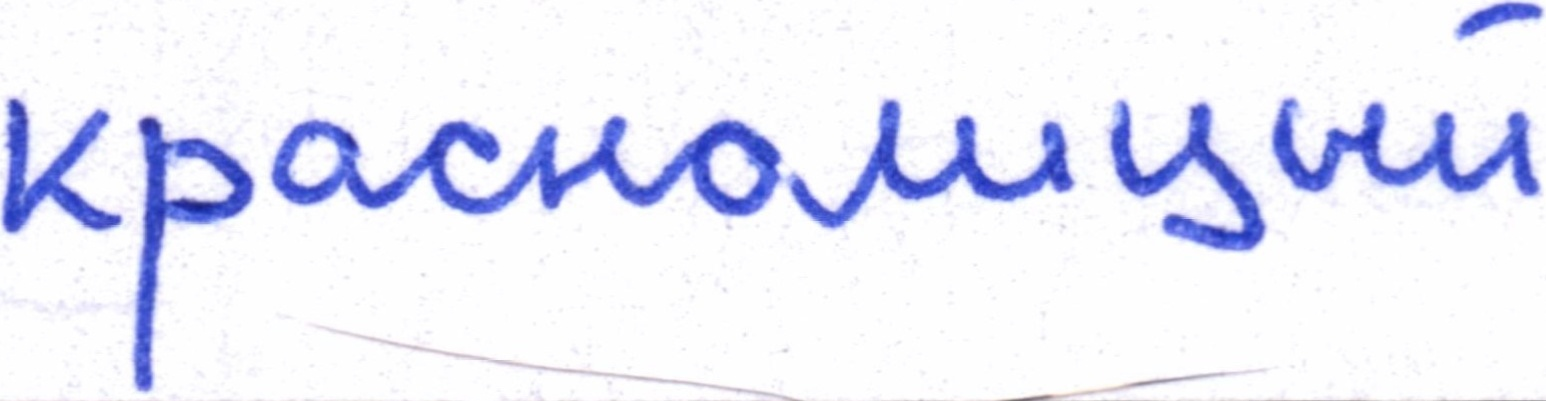краснолицый
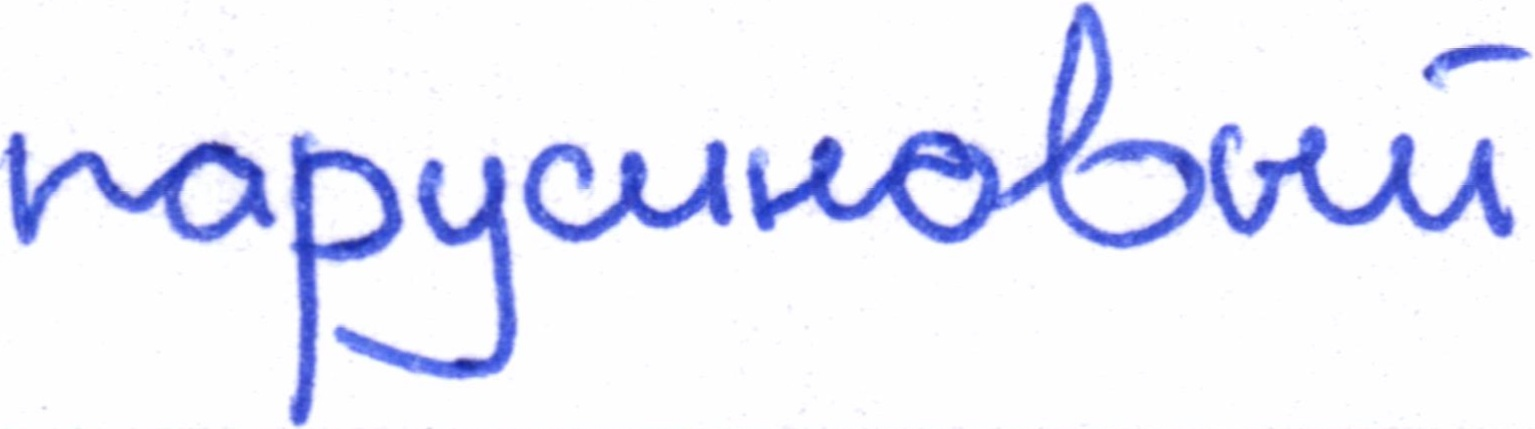парусиновый
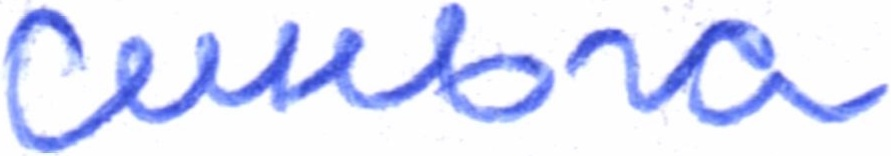синьга
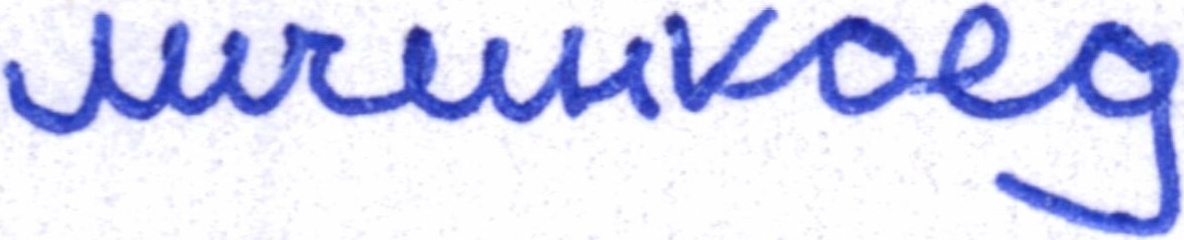личинкоед
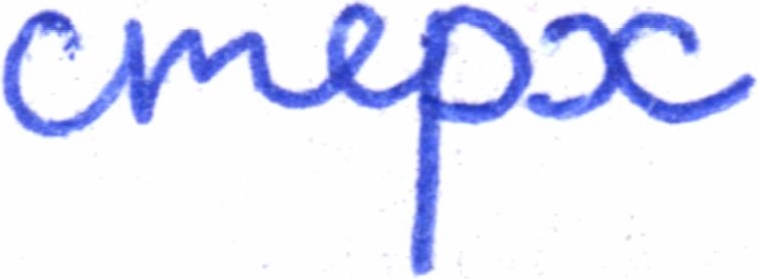стерх
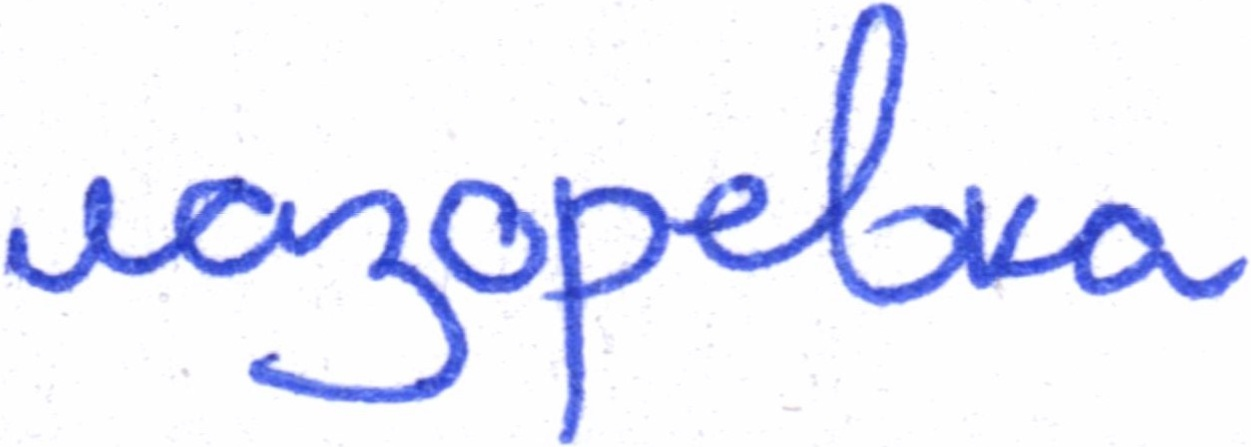лазоревка
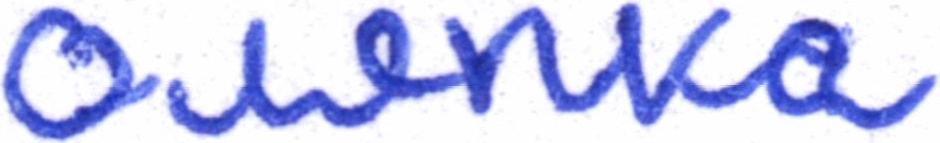оляпка
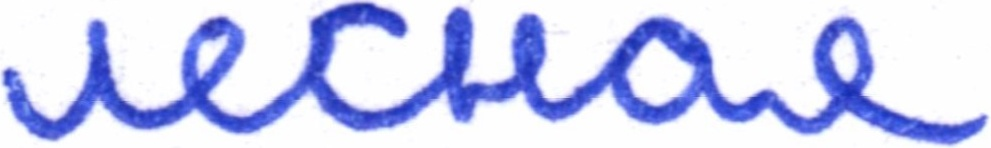лесная
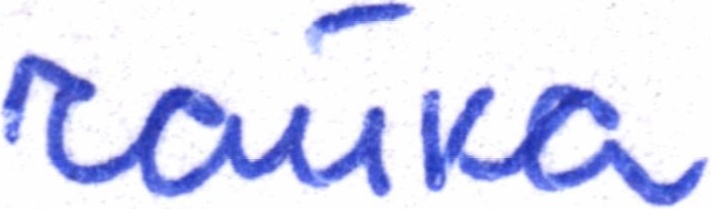чайка
